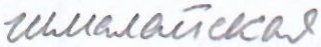гималайская
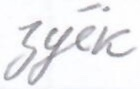зуёк
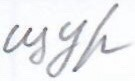щур
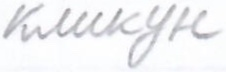кликун
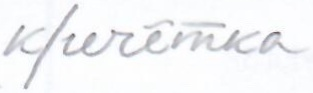кречётка
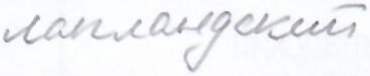лапландский
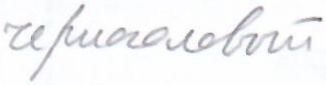черноголовый
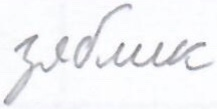зяблик
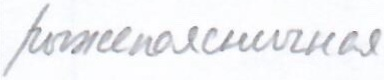рыжепоясничная
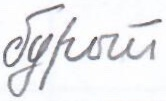бурый
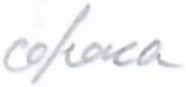сорока
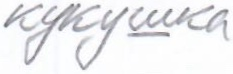кукушка
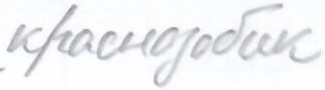краснозобик
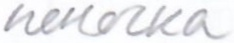пеночка
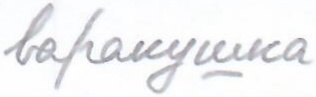варакушка
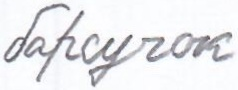барсучок
